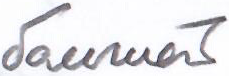большой
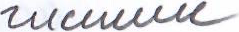чистик
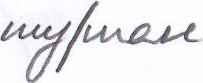турпан
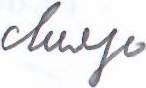свиязь
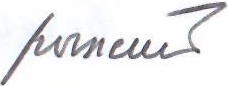рыжий
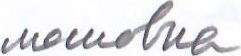московка
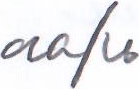огарь
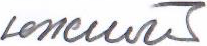южный
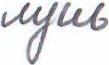лунь
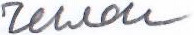чеглок
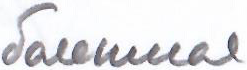болотная
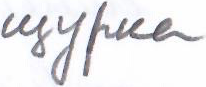щурка
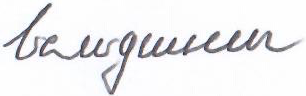вальдшнеп
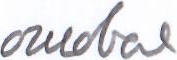очковая
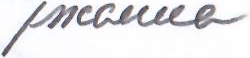ржанка
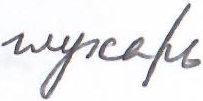глухарь
